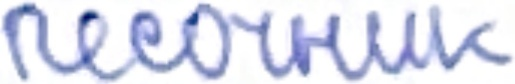песочник
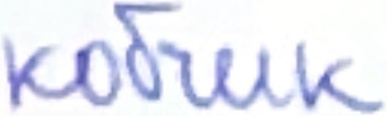кобчик
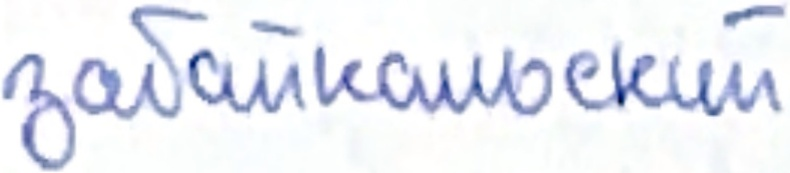забайкальский
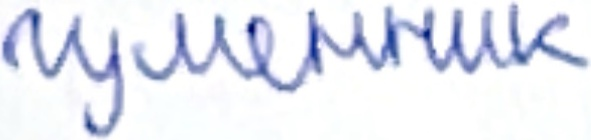гуменник
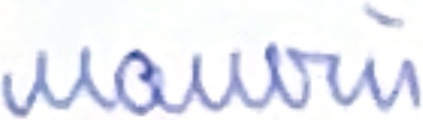малый
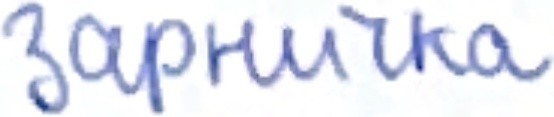зарничка
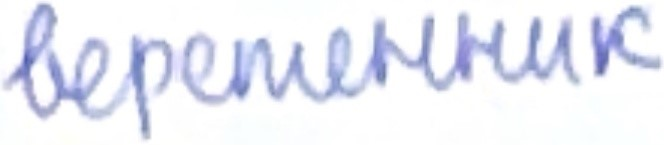веретенник
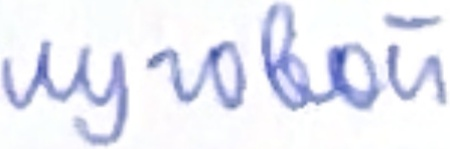луговой
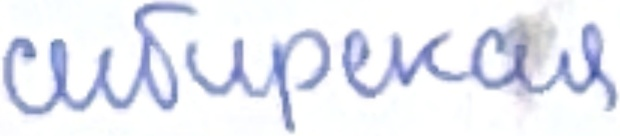сибирская
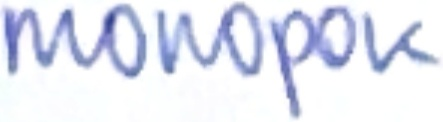топорок
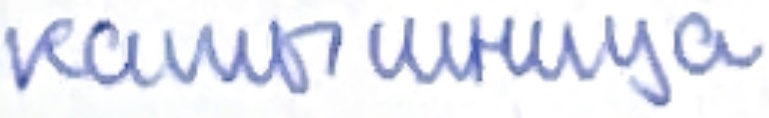камышница
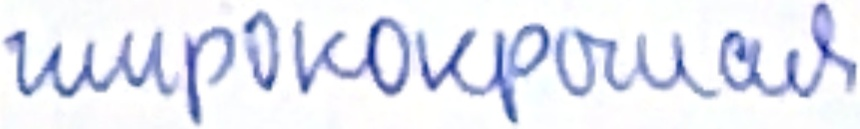ширококрылая
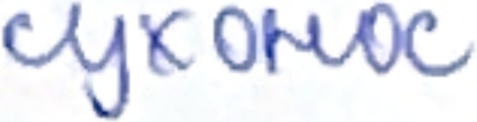сухонос
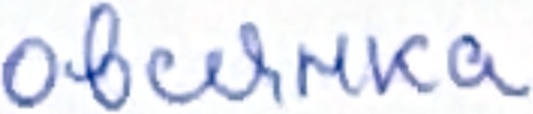овсянка
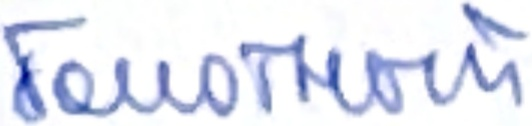боиотный
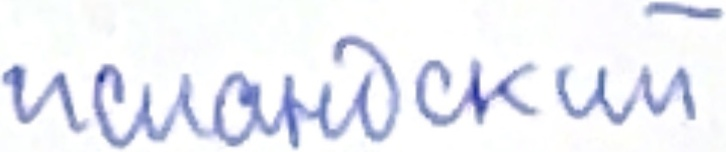исландский
